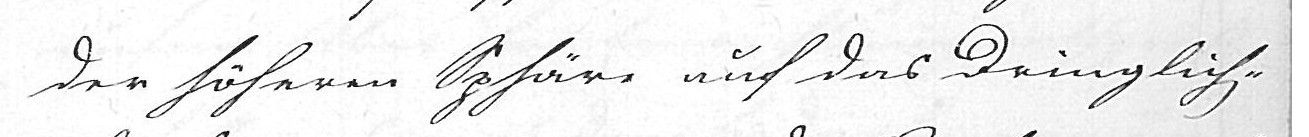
der höheren Sphäre auf das dringlich-
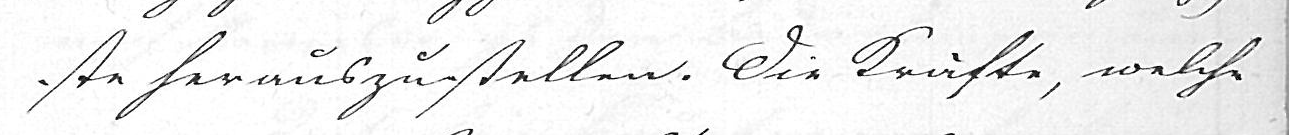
ste herauszustellen. Die Kräfte, welche
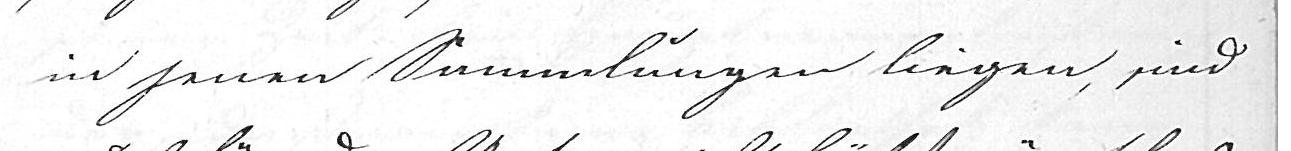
in jenen Sammlungen liegen, sind
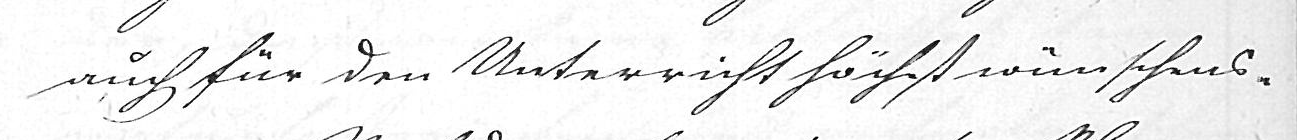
auch für den Unterricht höchst wünschens-
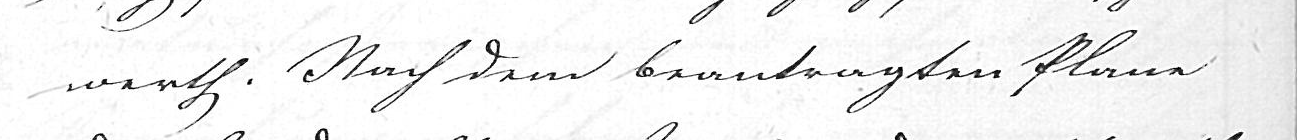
werth. Nachdem beantragten Plane
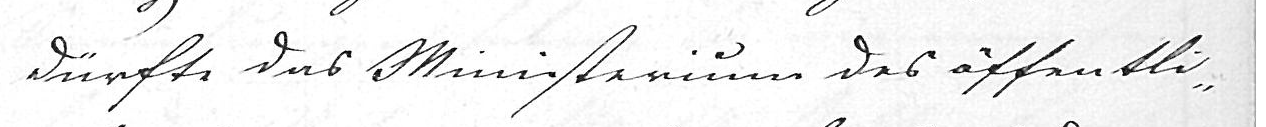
dürfte des Ministerium des öffentli-
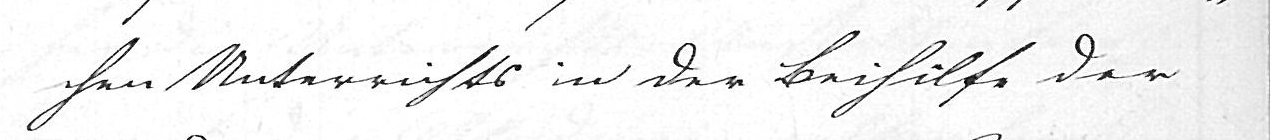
chen Unterrichts in der Beihilfe der
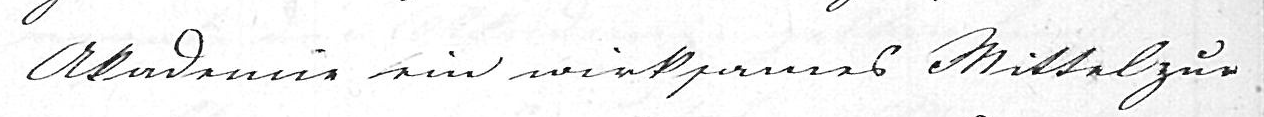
Akademie ein wirksames Mittel zur
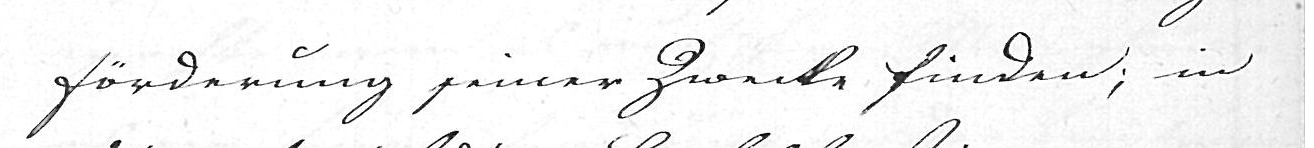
Förderung seiner Zwecke finden; in
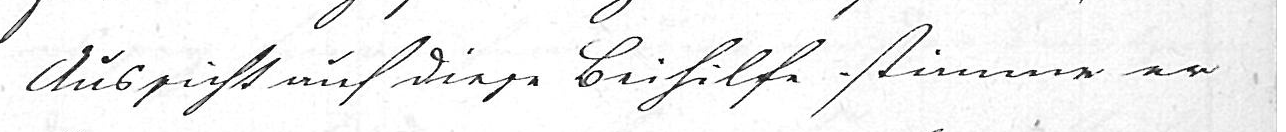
Aussicht auf diese Beihilfe stimme er
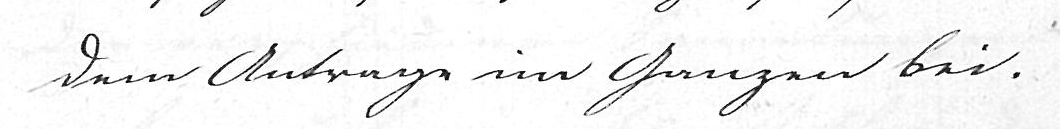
dem Antrage um Ganzen bei.
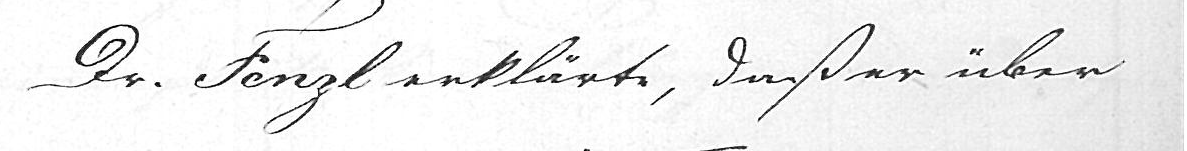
Dr. Fenzl erklärte, daß er über
